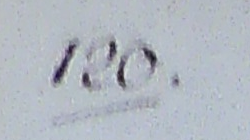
120.
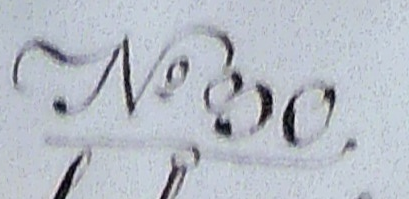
No͇ 30.
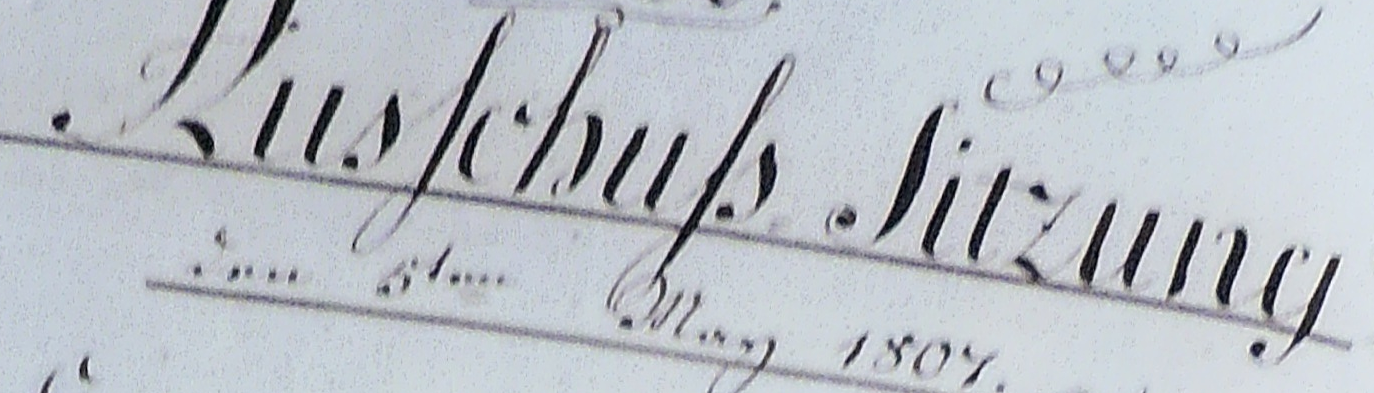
Ausschuss‗Sitzung
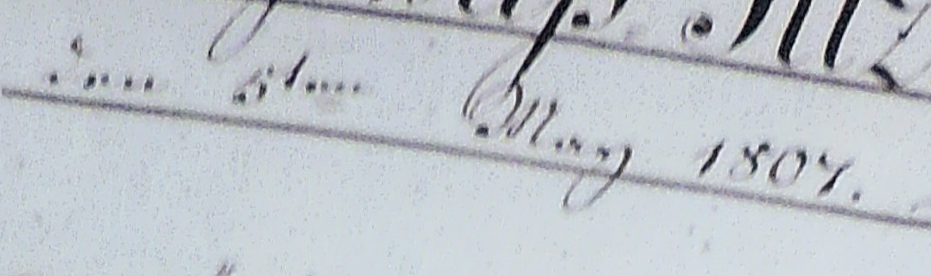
den 5te͇n May 1807.
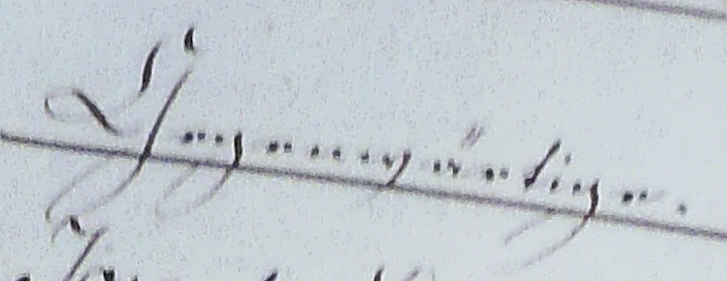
Gegenwärtige
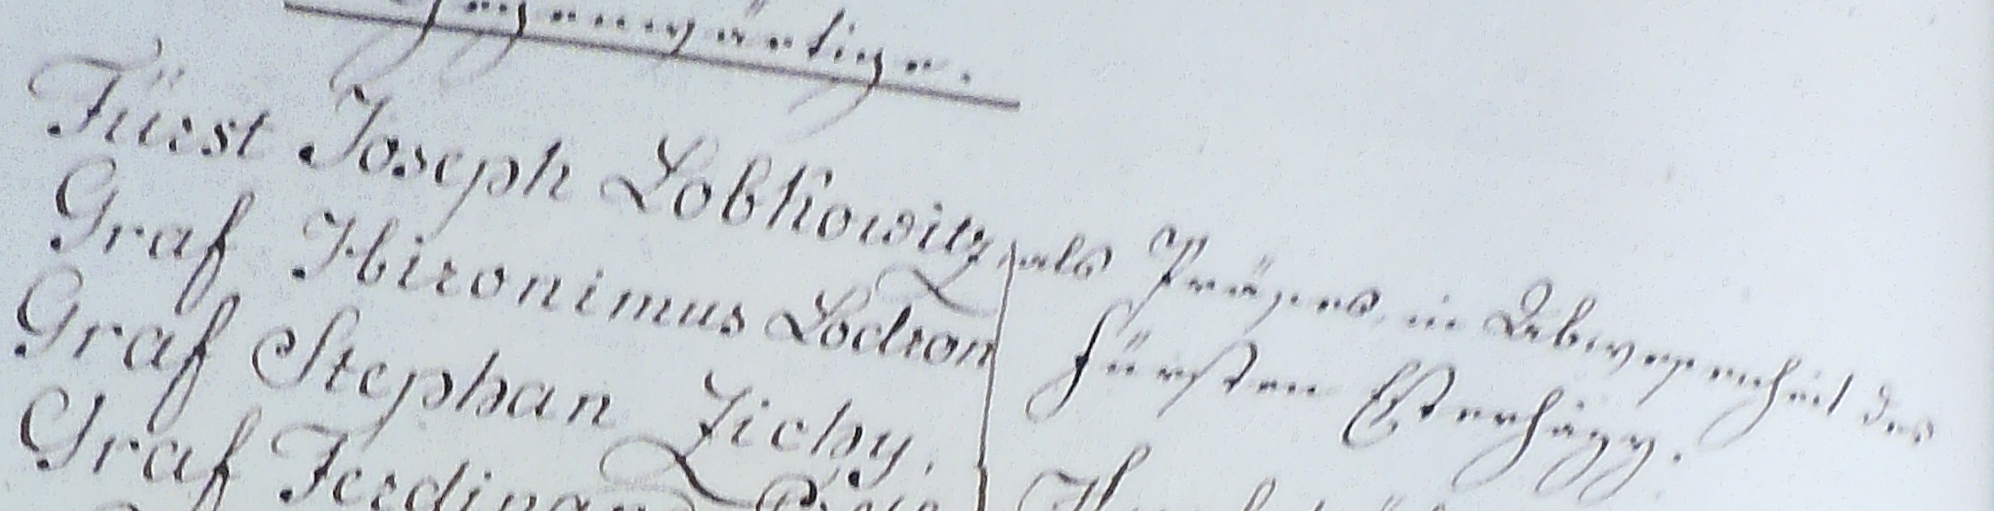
Fürst Joseph Lobkowitz als Präses in Abwesencheit des
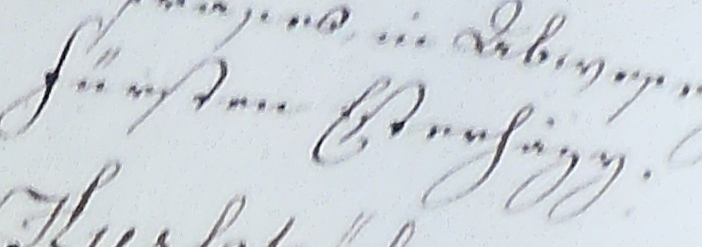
Fürsten Esterhàzy.
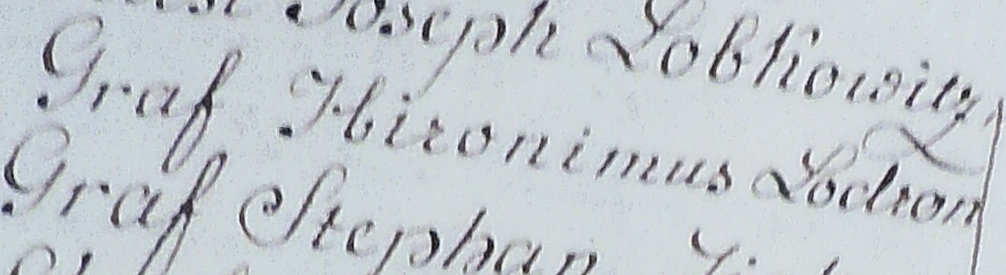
Graf Hironimus Lodron
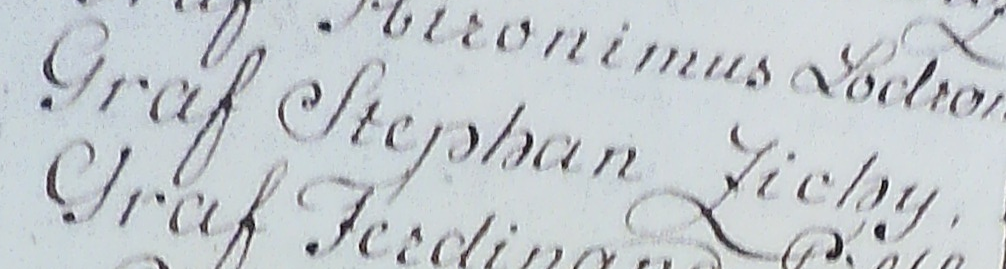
Graf Stephan Zichy.
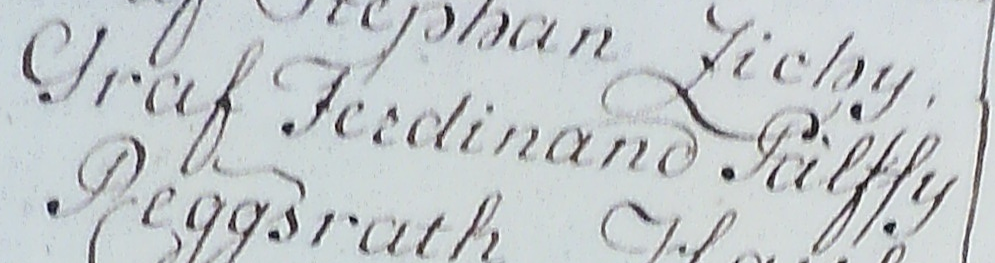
Graf Ferdinand Pàlffy.
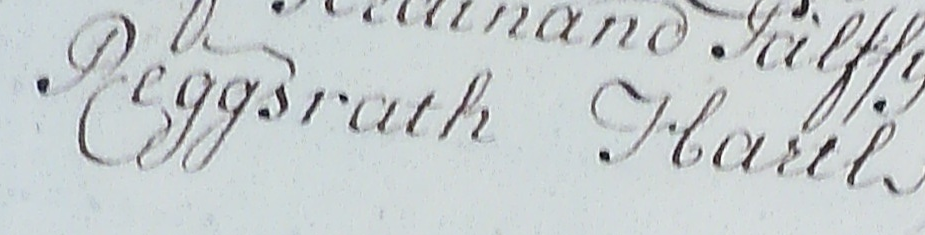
Reg͞gsrath Hartl
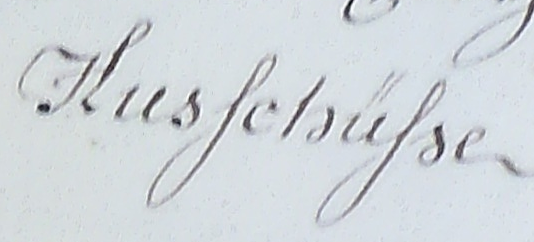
Ausschüsse.
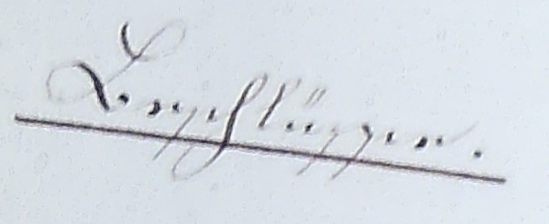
Beschlüsse.
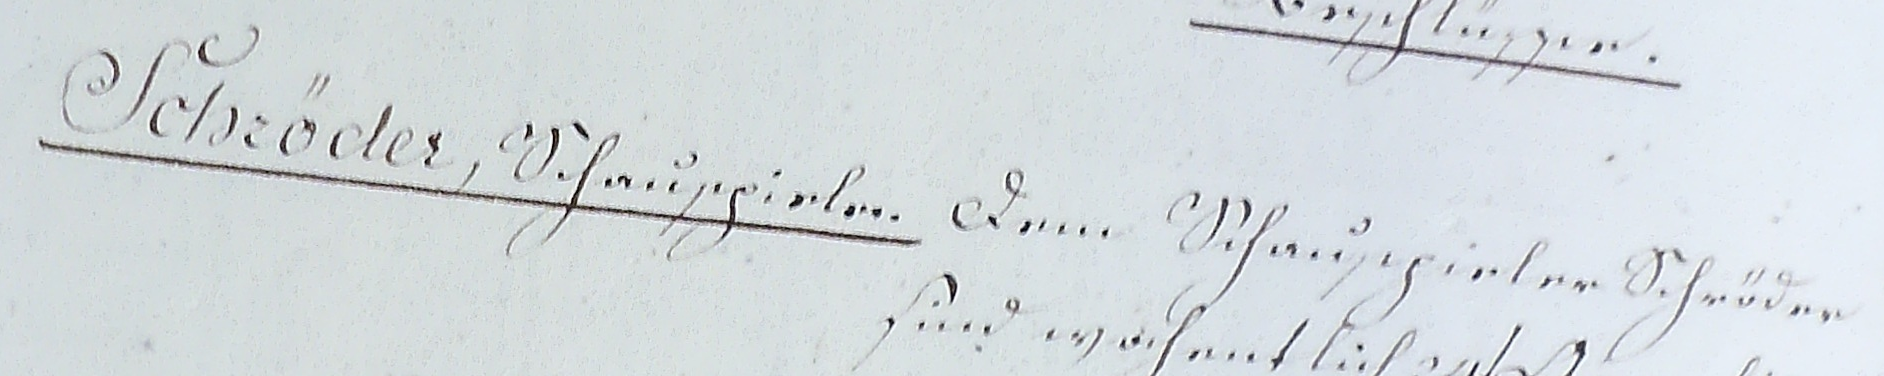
Schröder, Schauspieler. Dem Schauspieler Schröder
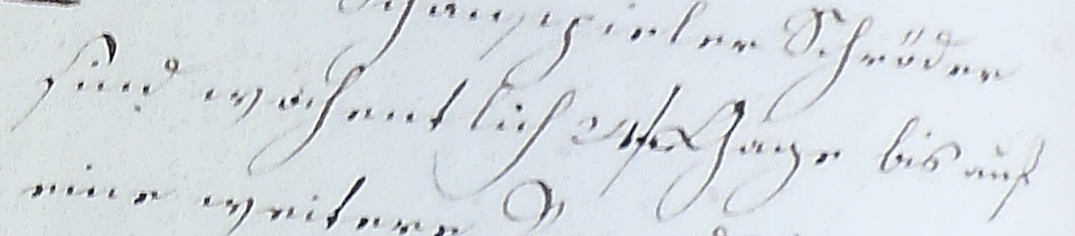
sind wöchentlich 24fr. Gage bis auf
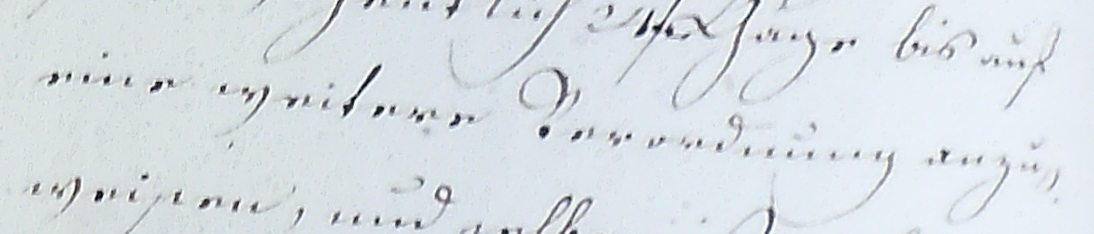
eine weitere Verordnung anzu¬
